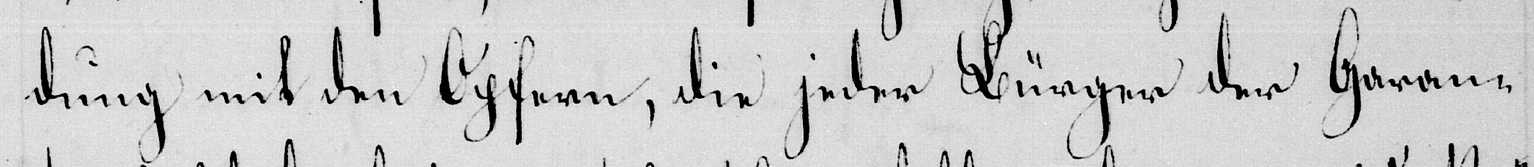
dung mit den Opfern, die jeder Bürger der Garan¬
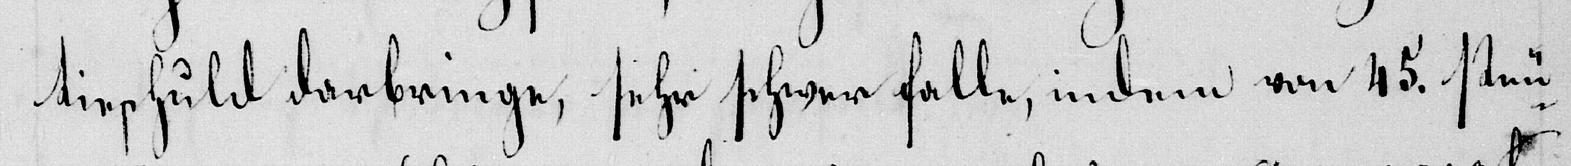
tieschuld darbringe, sehr schwer falle, indem von 45. steu¬
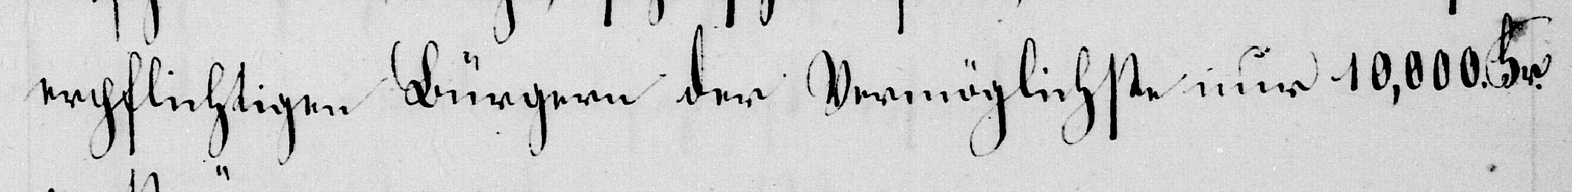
erpflichtigen Bürgern der Vermöglichste nur 10,000. Fr.
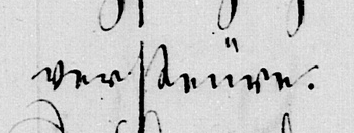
versteure.
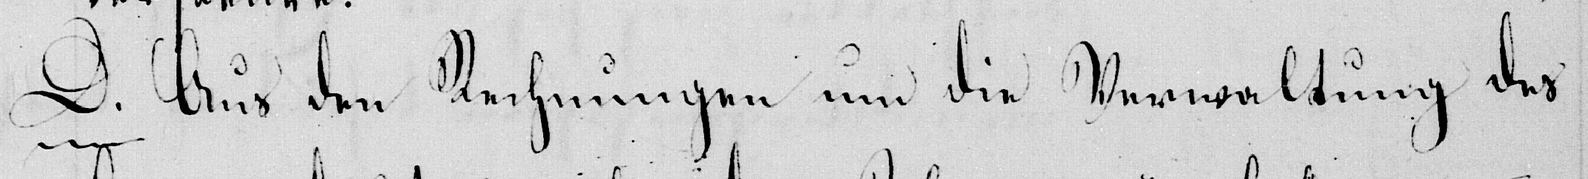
D. Aus den Rechnungen um die Verwaltung des
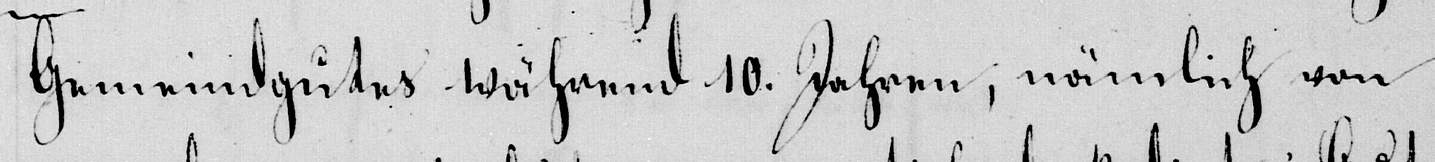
Gemeindgutes während 10. Jahren, nämlich von
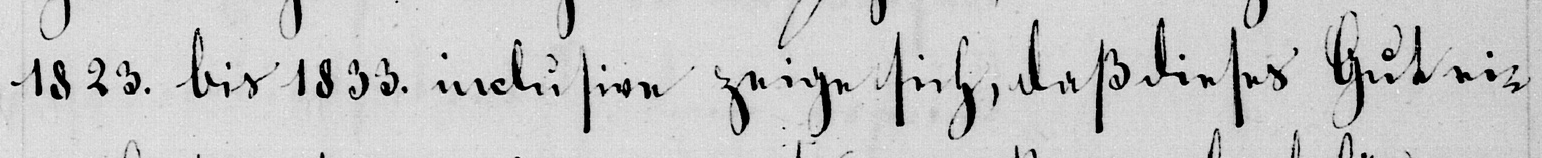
1823. bis 1833. inclusive zeige sich, daß dieses Gut ei¬
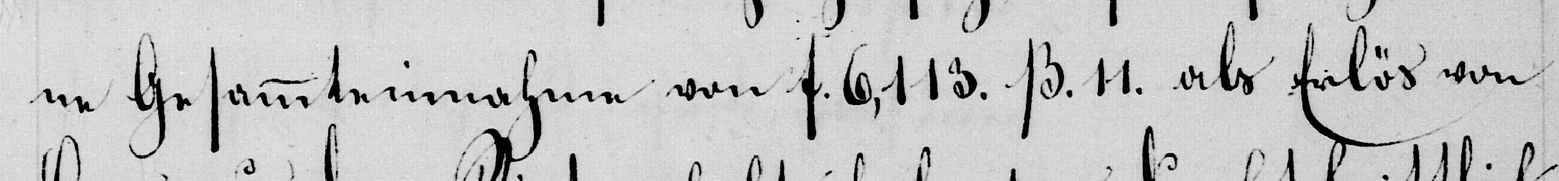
ne Gesammteinnahme von f. 6113. ß. 11. als Erlös von
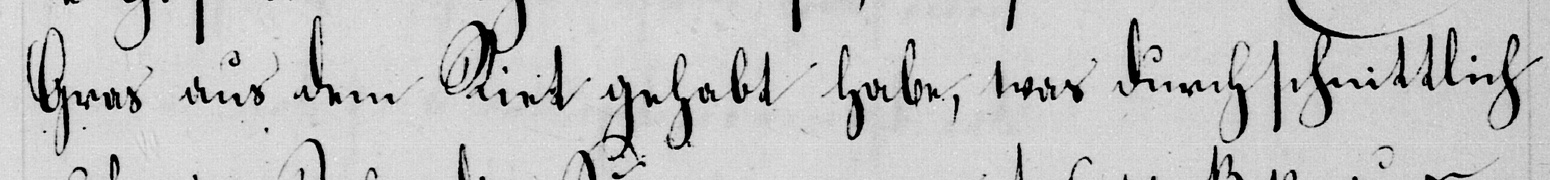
Gras aus dem Riet gehabt habe, was durchschnittlich
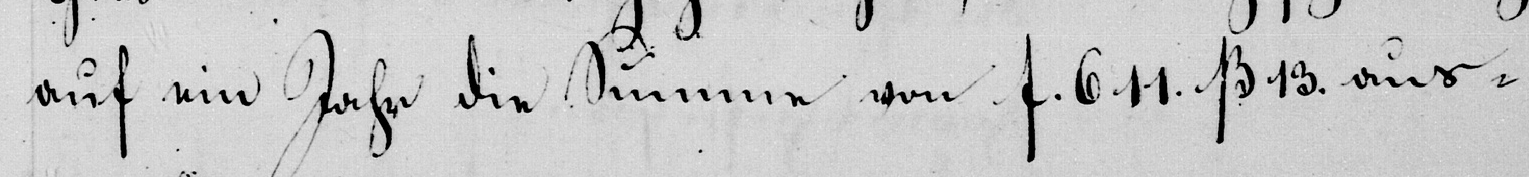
auf ein Jahr die Summe von f. 611. ß. 13. aus¬
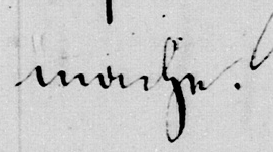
mache.
